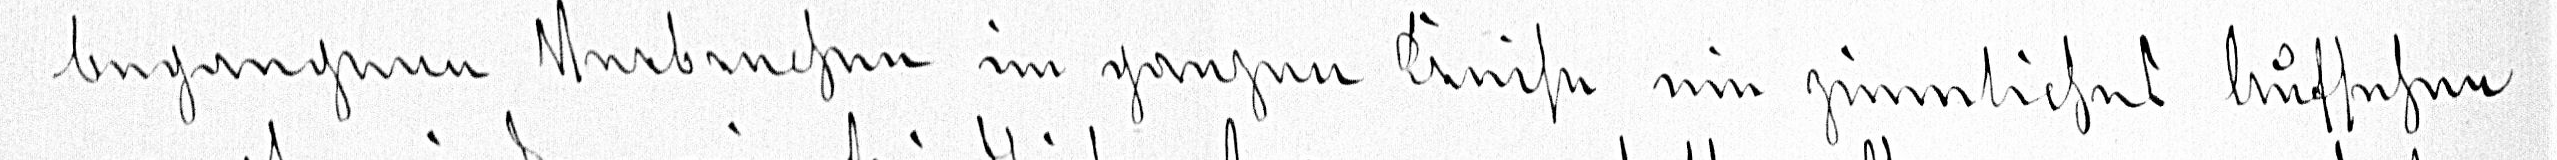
begangene Verbrechen im ganzen Kreise ein ziemliches Aufsehen
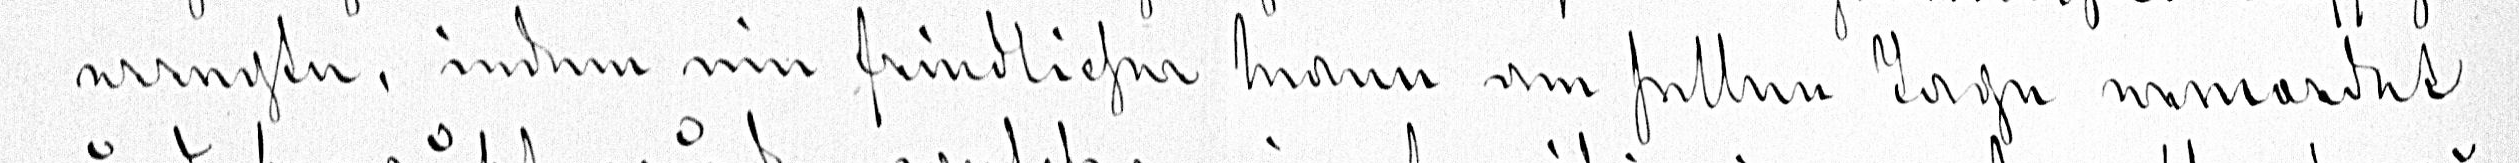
erregte, indem ein friedlicher Mann am hellen Tage ermordet
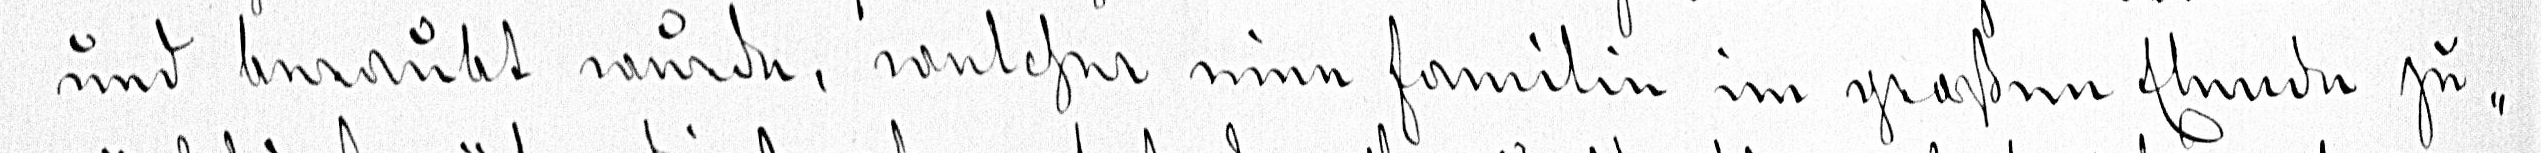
und beraubt wurde, welcher eine Familie im großen Elende zu¬
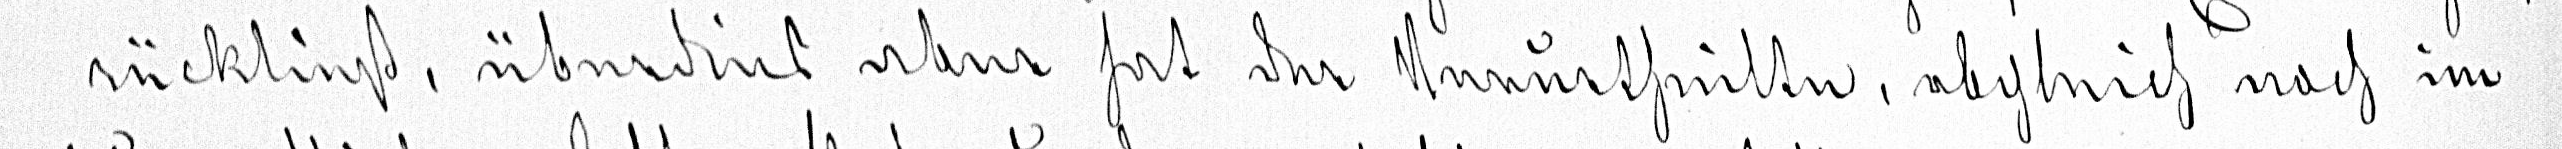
rückließ, überdies aber hat der Verurtheilte, obgleich noch im
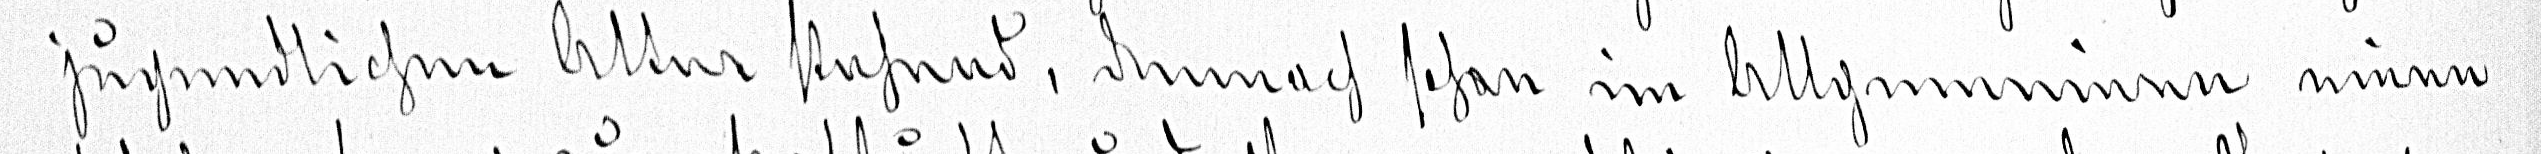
jugendlichen Alter stehend, dennoch schon im Allgemeinen einen
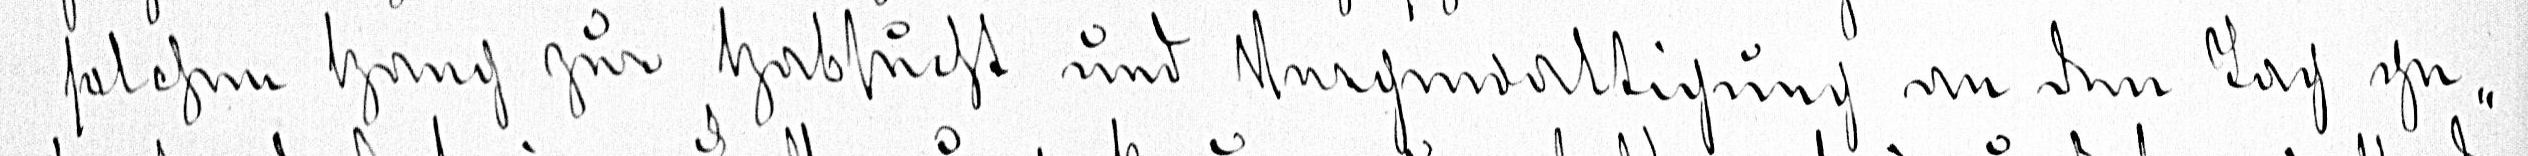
solchen Hang zur Habsucht und Vergewaltigung an den Tag ge¬
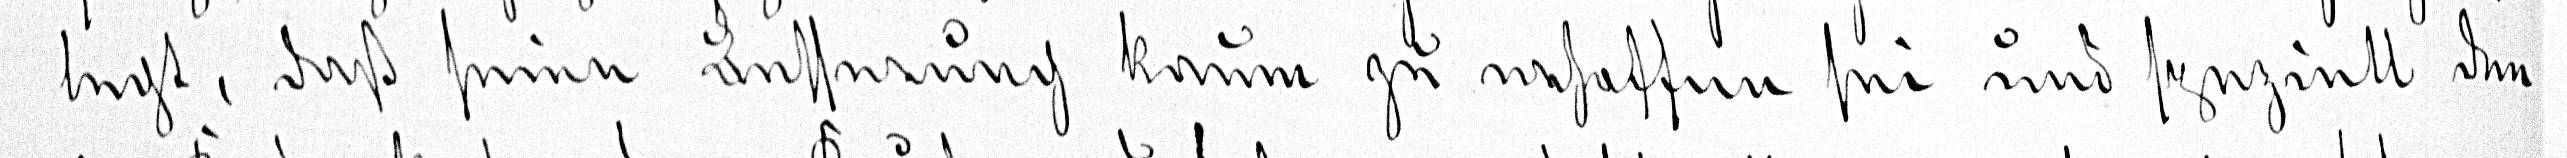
legt, daß seine Besserung kaum zu erhoffen sei und speziell den
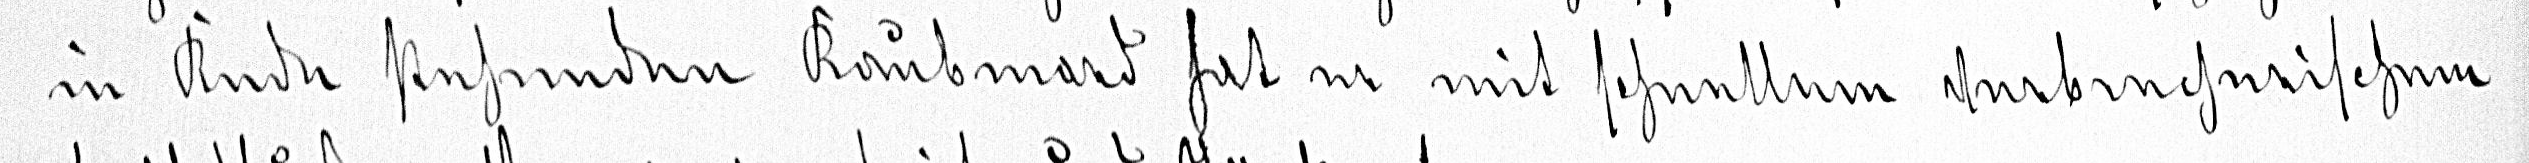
in Rede stehenden Raubmord hat er mit schnellem verbrecherischem
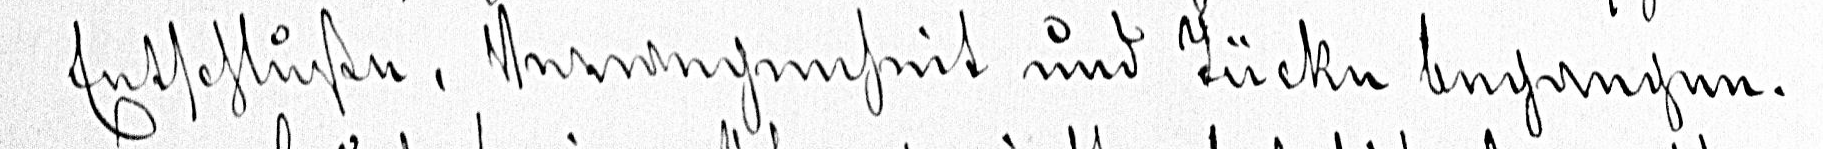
Entschluße, Verwegenheit und Tücke begangen.
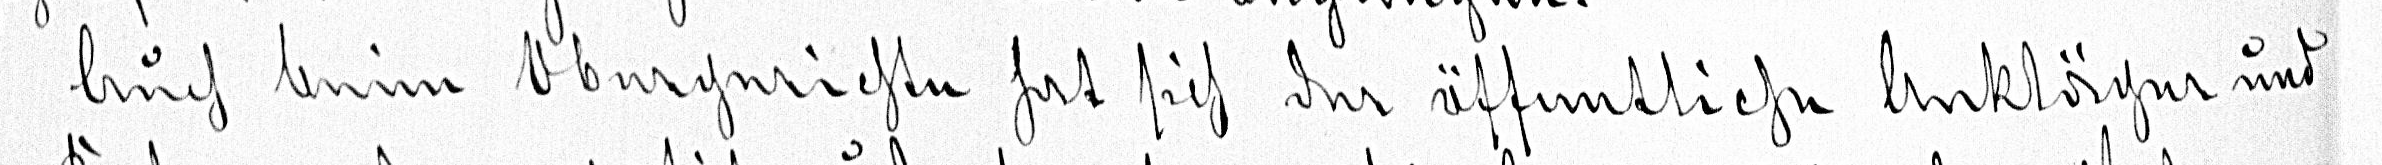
Auch beim Obergerichte hat sich der öffentliche Ankläger und
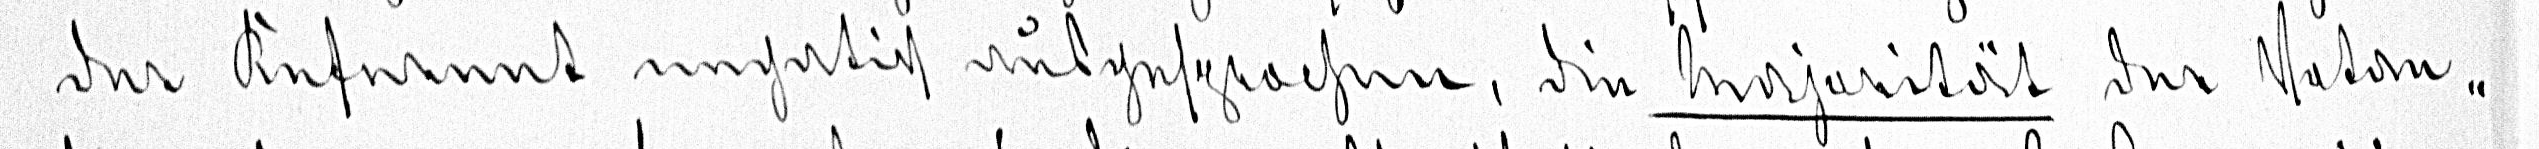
der Referent negativ ausgesprochen, die Majorität der Votan¬
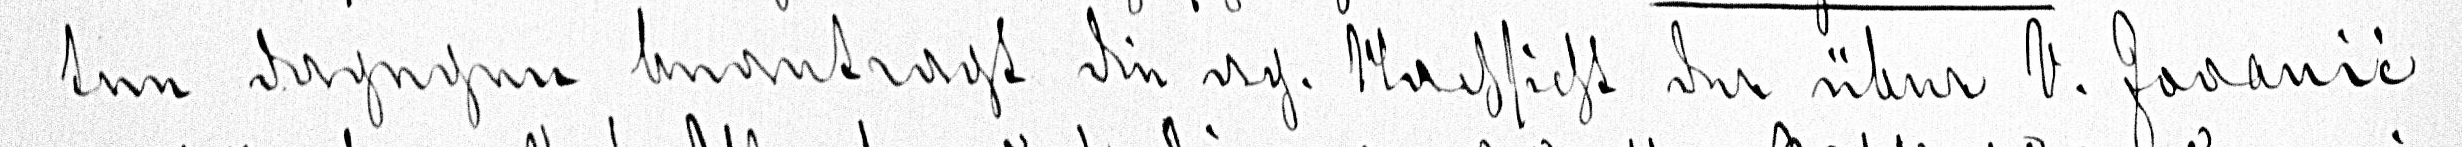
ten dagegen beantragt die ag. Nachsicht der über V. Jovanić
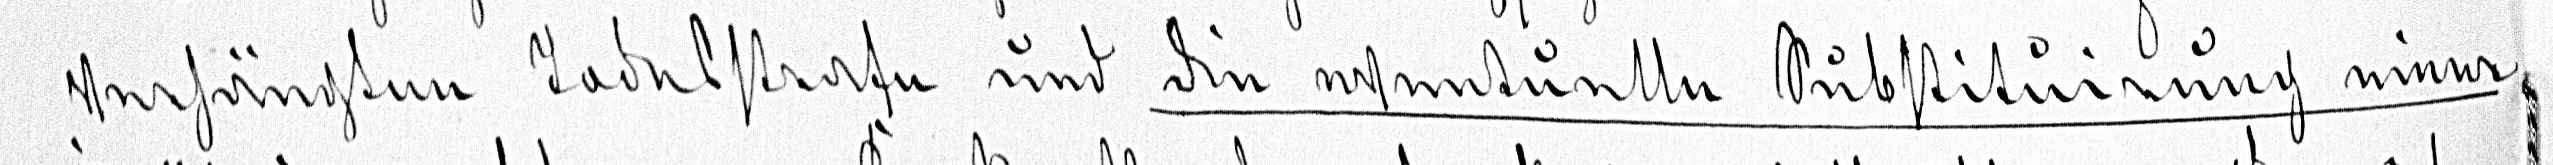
verhängten Todesstrafe und die eventuelle Substituirung einer
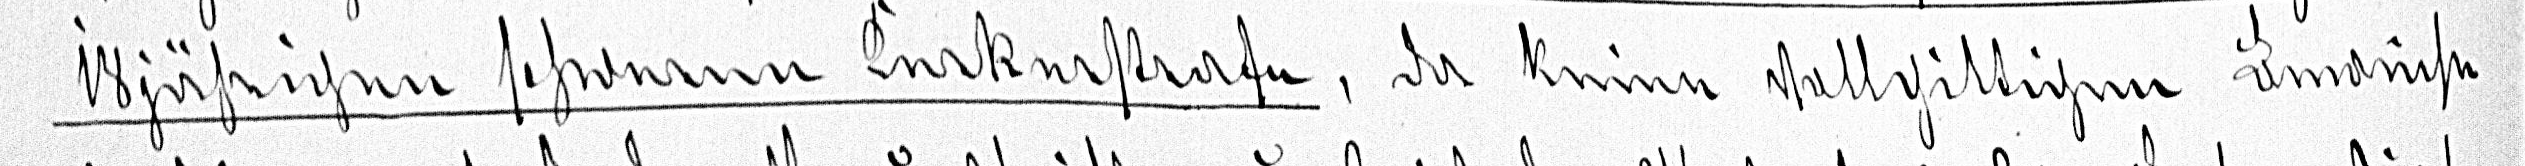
18jährigen schweren Kerkerstrafe, da keine vollgiltigen Beweise
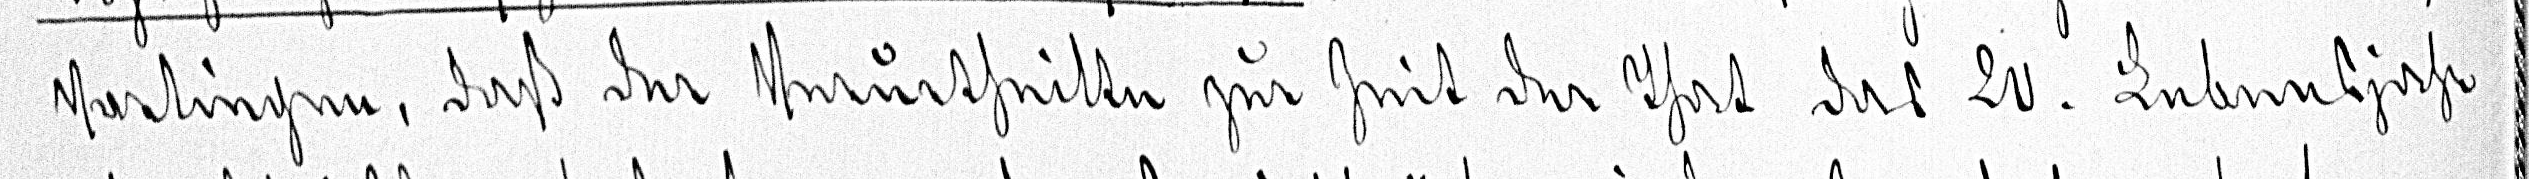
vorliegen, daß der Verurtheilte zur Zeit der That das 20. Lebensjahr
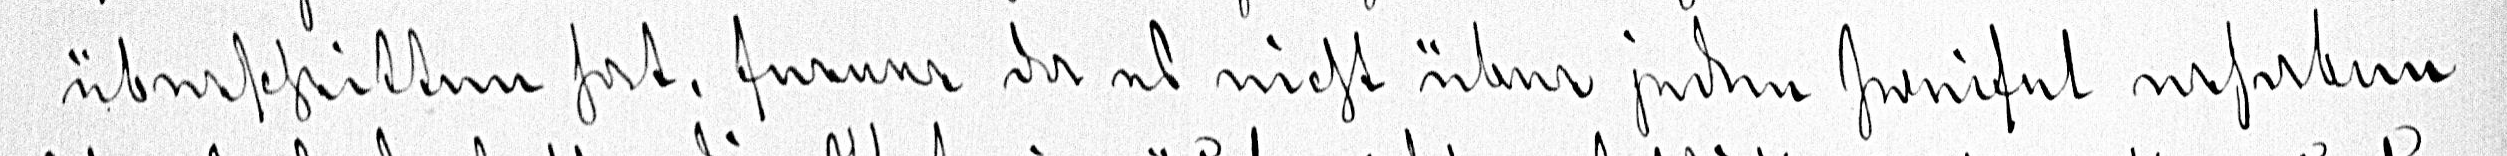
überschritten hat, ferner da es nicht über jeden Zweifel erhaben
